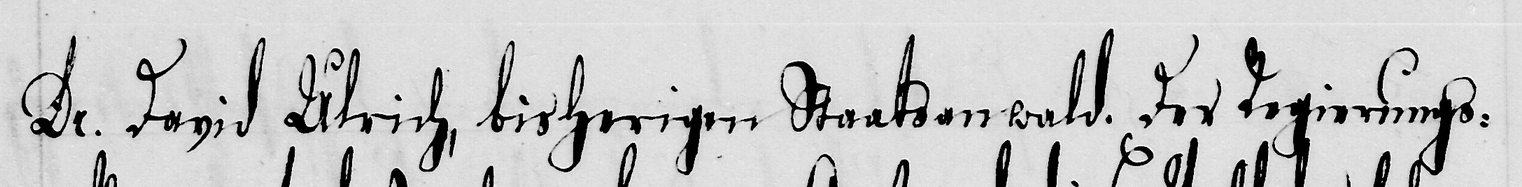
Dr. David Ulrich, bisherigen Staatsanwald. Der Regierungs¬
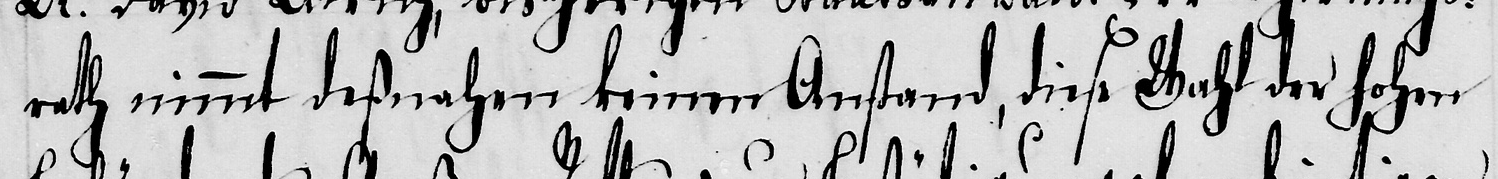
rath nimmt deßnahen keinen Anstand, diese Wahl der Hohen
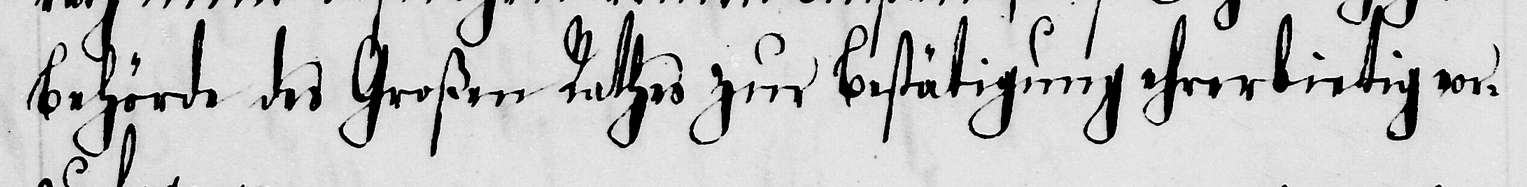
Behörde des Großen Rathes zur Bestätigung ehrerbietig vor¬
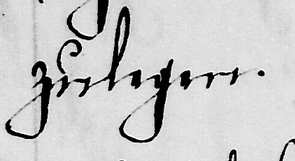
zulegen.
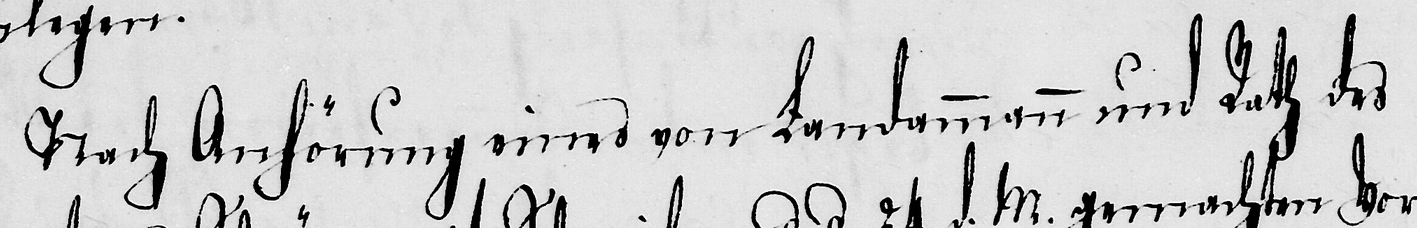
Nach Anhörung eines von Landammann und Rath des
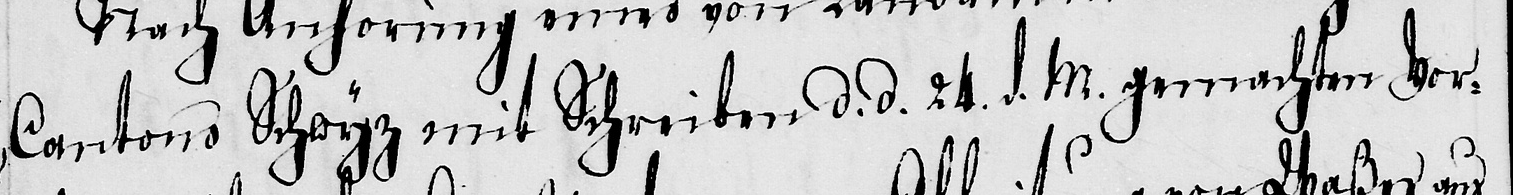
Cantons Schwyz mit Schreiben d. d. 24. d. M. gemachten Vors¬
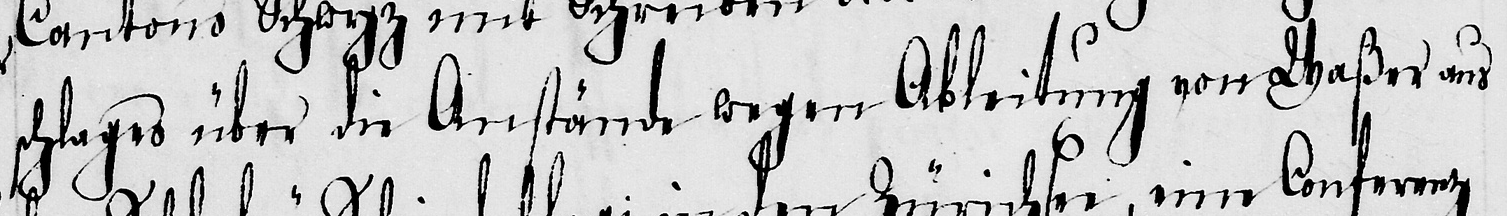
chlages über die Anstände wegen Ableitung von Waßer aus
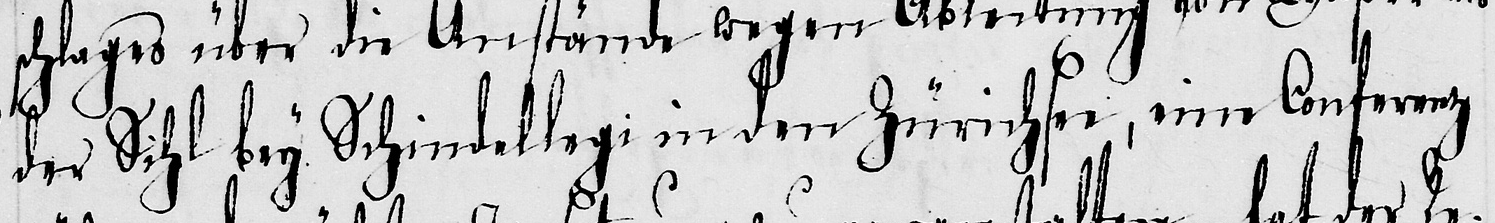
der Sihl bey Schindellegi in den Zürichsee, eine Conferenz
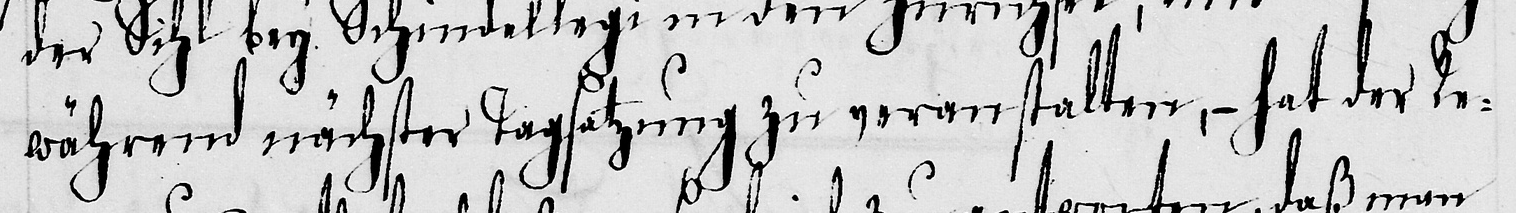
während nächster Tagsatzung zu veranstalten, – hat der Re¬
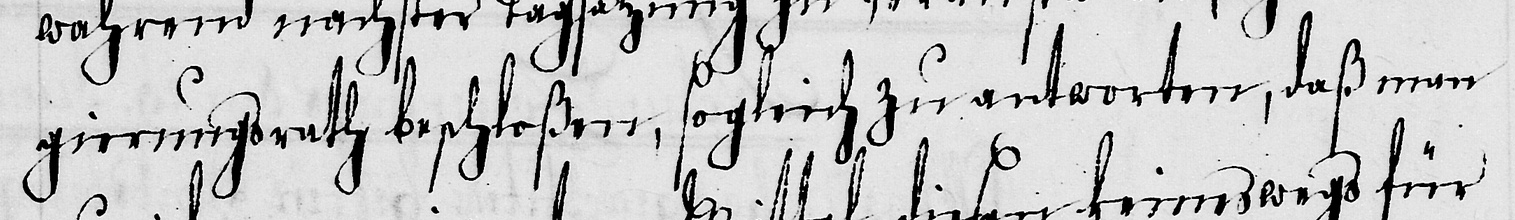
gierungsrath beschloßen, sogleich zu antworten, daß man
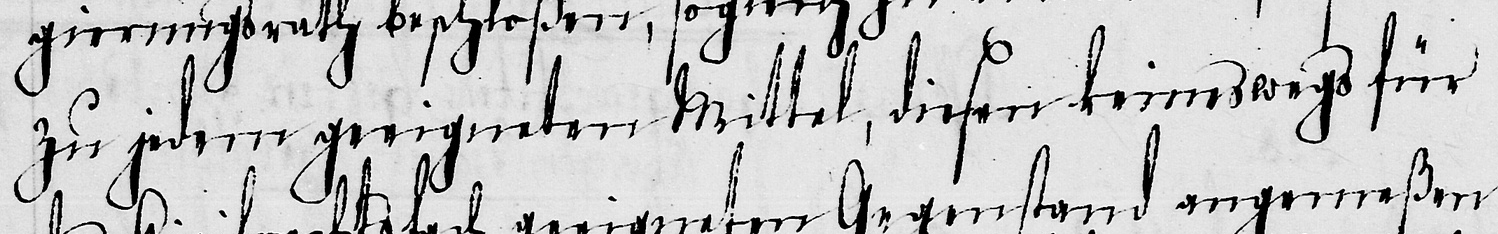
zu jedem geeigneten Mittel, diesen keineswegs für
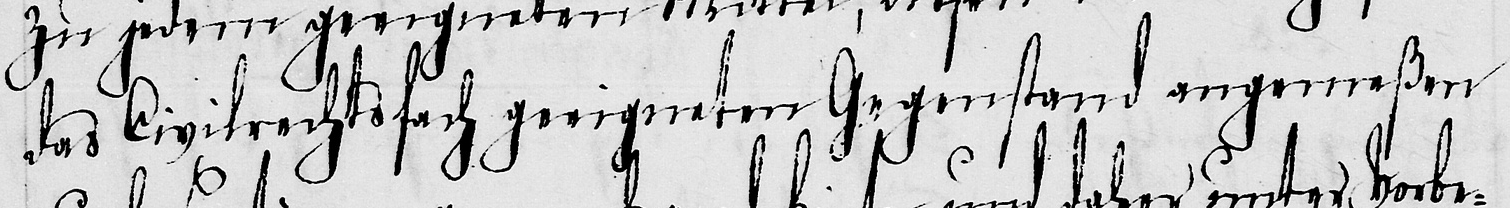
das Civilrechtsfach geeigneten Gegenstand angemeßen
